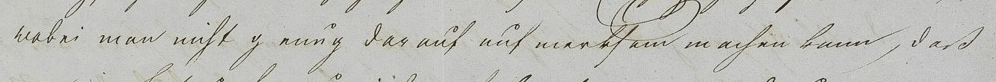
wobei man nicht genug darauf aufmerksam machen kann, daß
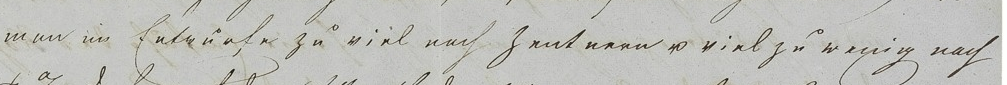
man im Entwurfe zu viel nach Zentnern & viel zu wenig nach
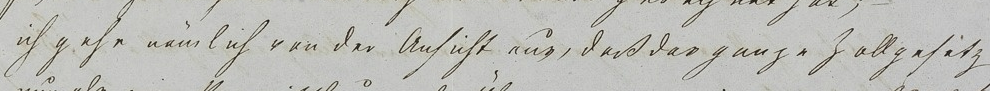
ich gehe nämlich von der Ansicht aus, daß das ganze Zollgesetz
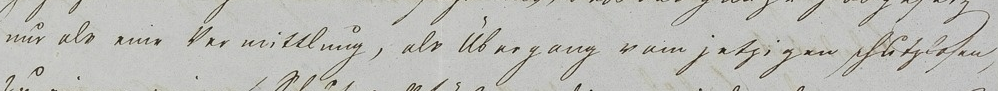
nur als eine Vermittlung, als Übergang vom jetzigen schutzlosen,
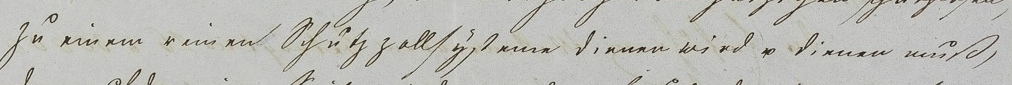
zu einem reinen Schutzzollsysteme dienen wird & dienen muß,
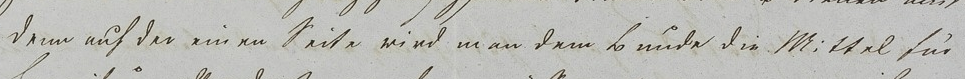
denn auf der einen Seite wird man dem Bunde die Mittel für
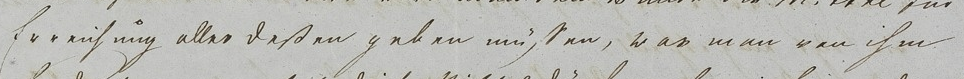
Erreichung alles deßen geben müssen, was man von ihm
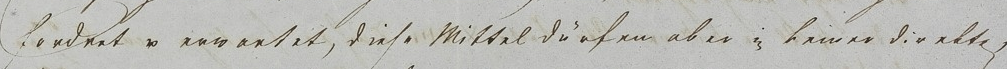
fordert & erwartet, diese Mittel dürfen aber in keiner direkten,
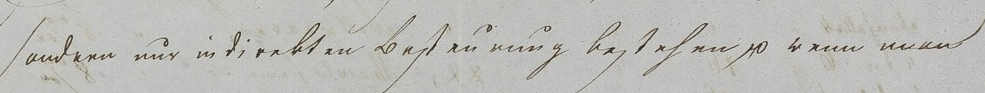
sondern nur indirekten Besteurung bestehen & wenn man
